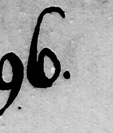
40.
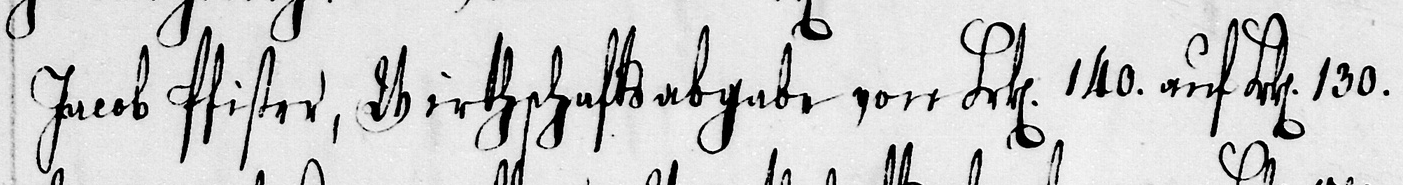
Jacob Pfister, Wirthschaftsabgabe von Frk[en]. 140.
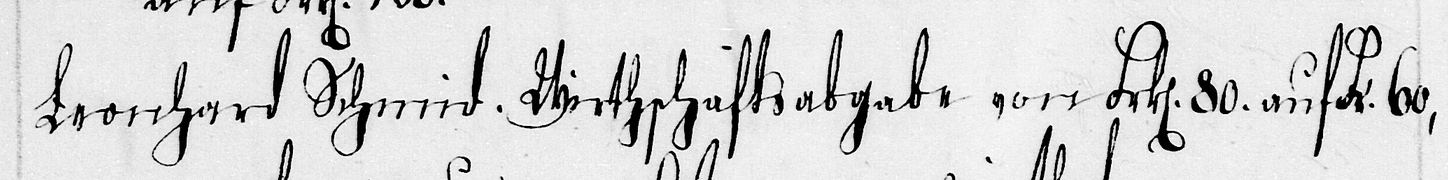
Leonhard Schmid. Wirtschaftsabgabe von Frk[en]. 80. auf
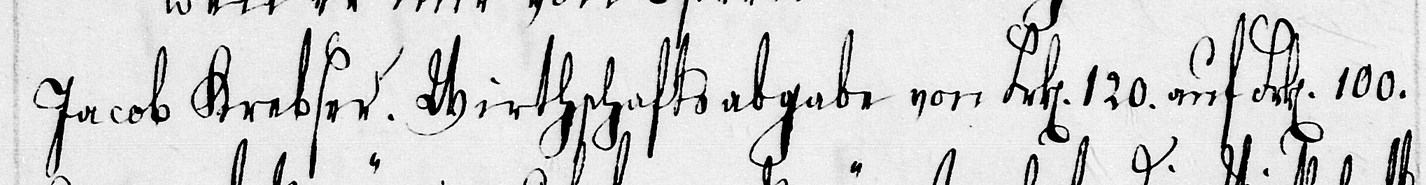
Jacob Krebser. Wirthschaftsabgabe von Frk[en]. 120.
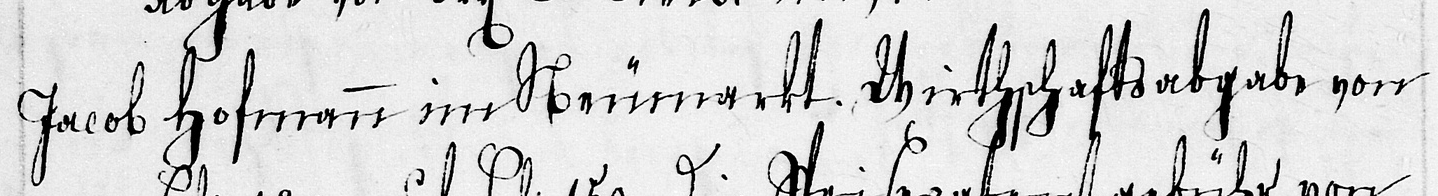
Jacob Hofmann im Neumarkt. Wirthschaftsabgabe von
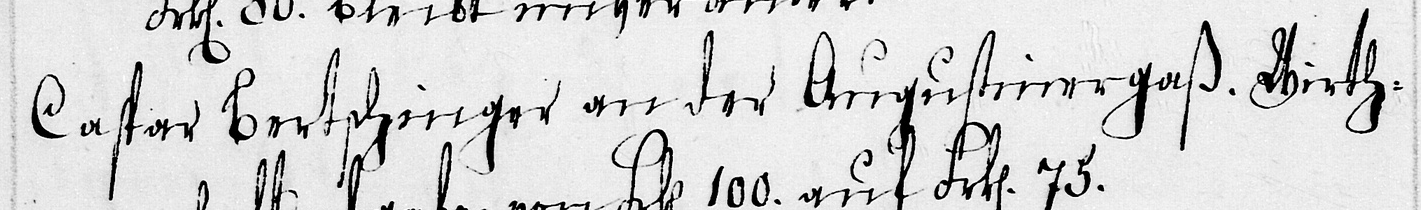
Caspar Bertschinger an der Augustinergaß. Wirth¬
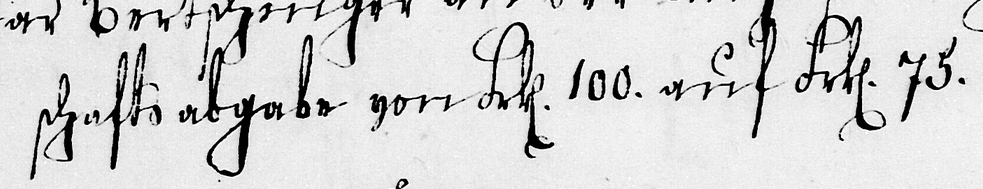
schaftsabgabe von Frk[en]. 100. auf Frk[en].
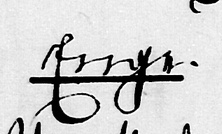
Enge.
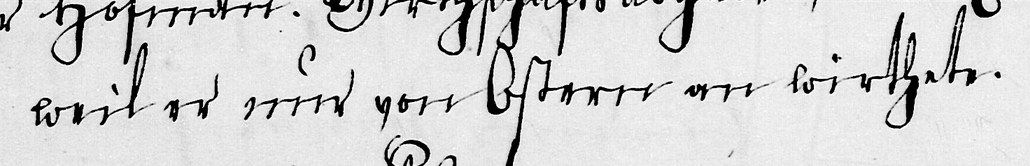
weil er nur von Ostern an wirthete.
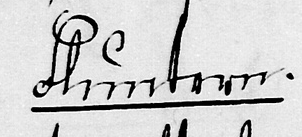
Fluntern.
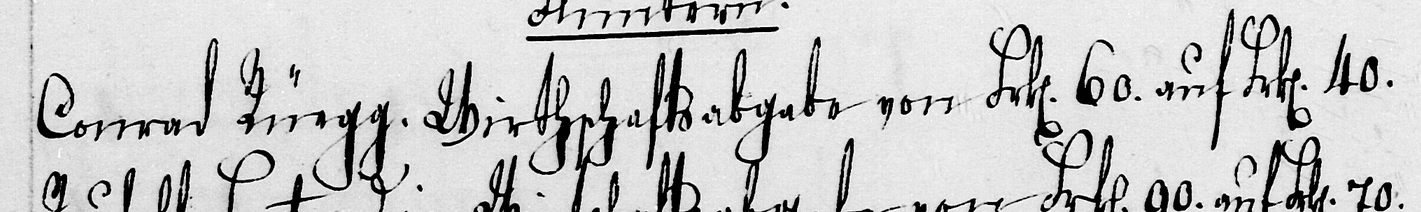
Conrad Rüegg. Wirthschaftsabgabe von Frk[en]. 60.
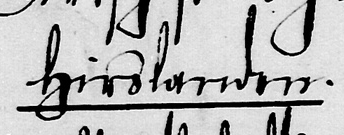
Hirslanden.
